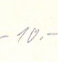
-10.-
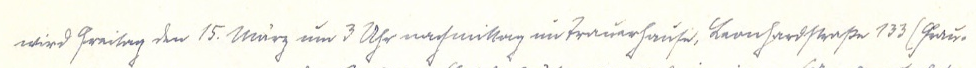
wird Freigag den 15. März um 3 Uhr nachmittag im Trauerhause, Leohnhardstraße 133 (Frau-
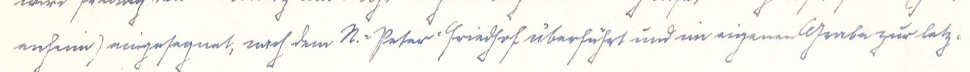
enheim) eingesegnet, nach dem St.-Peter-Friedhof überführt und im eigenen Grabe zur letz-
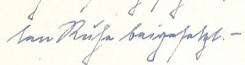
ten Ruhe beigesetzt. -
